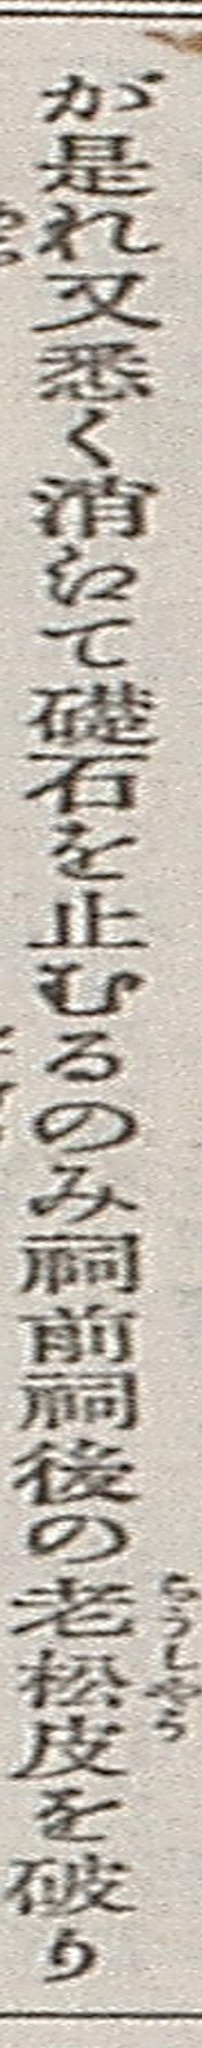が是れ又悉く消えて礎石を止むるのみ祠前祠後の老松皮を破り
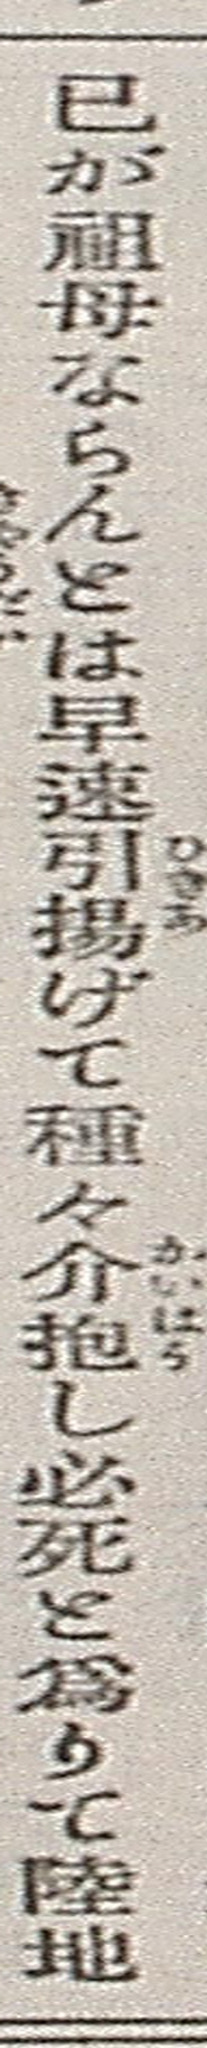巳が祖母ならんとは早速引揚げて種々介抱し必死と為りて陸地
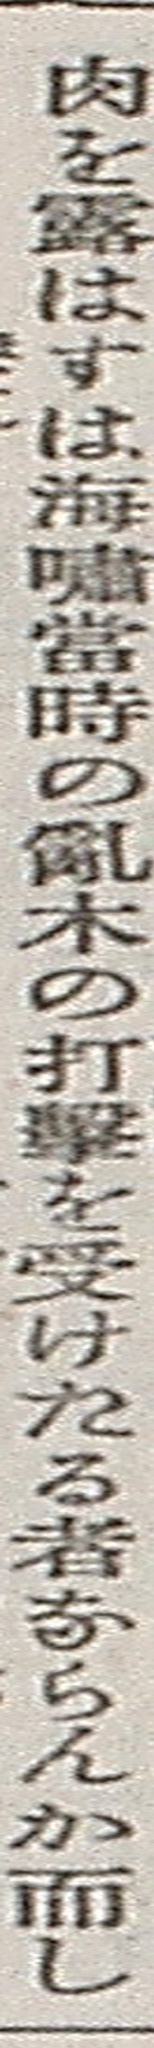肉を露はすは海嘯当時の乱木の打撃を受けたる者ならんか而し
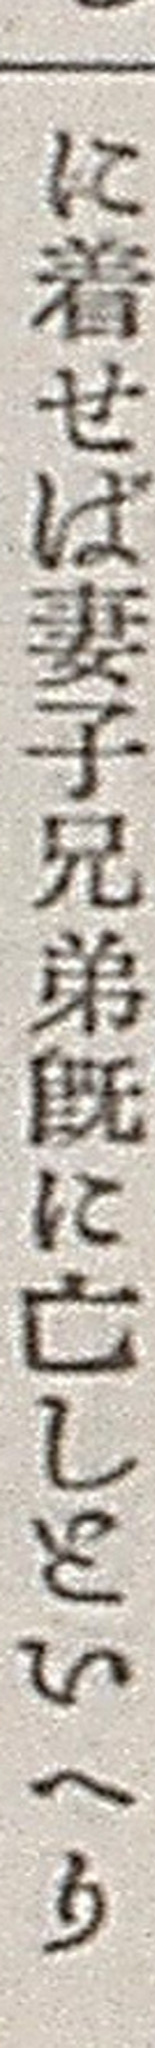に着せば妻子兄弟既に亡しといへり
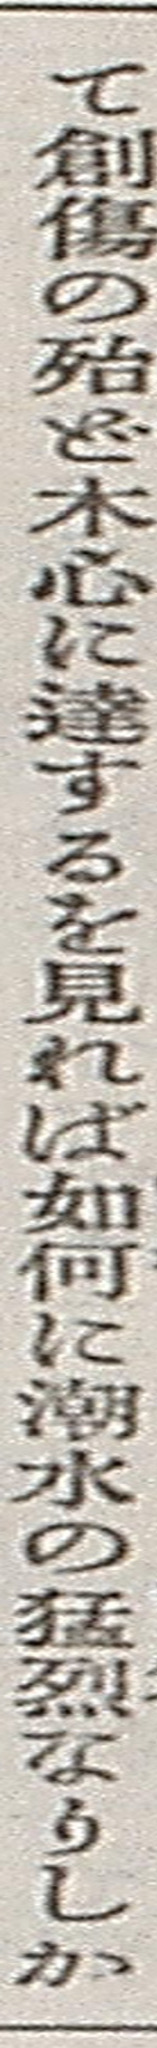て創傷の殆ど木心に達するを見れば如何に潮水の猛烈なりしか
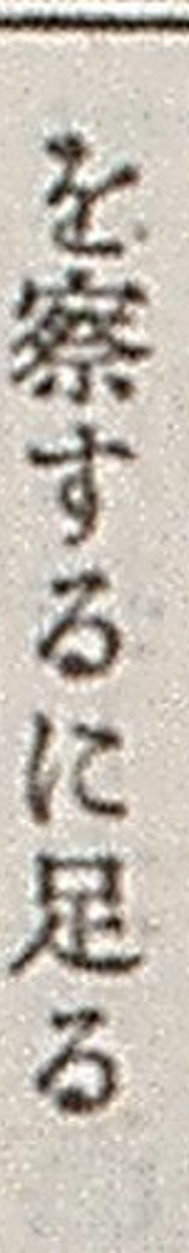を察するに足る
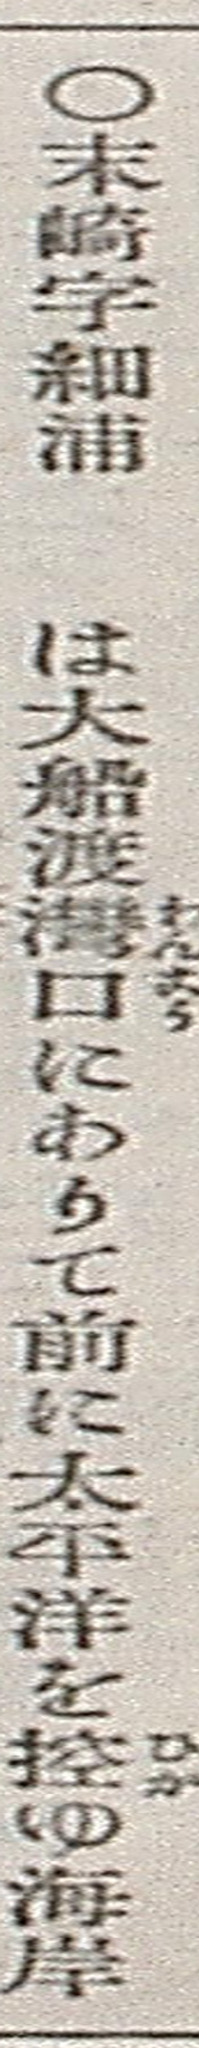○末崎村字細浦は大船渡湾口にありて前に太平洋を控ゆ海岸
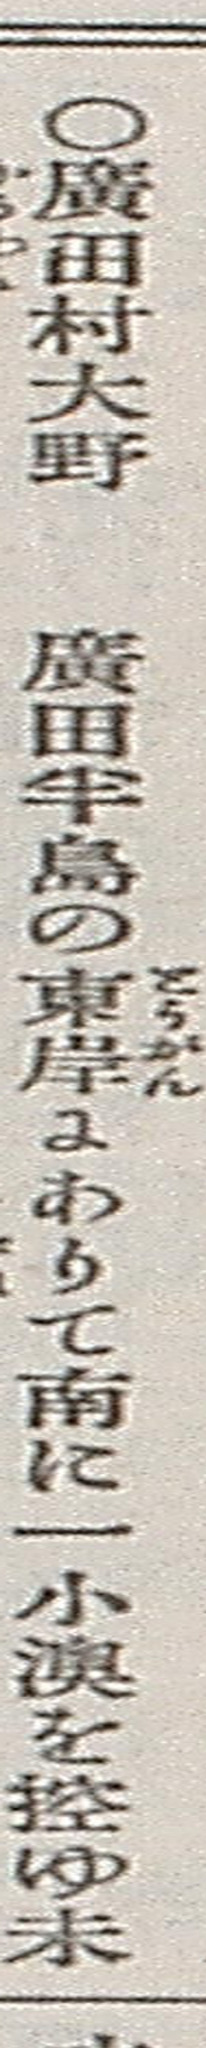○広田村大野広田半島の東岸にありて南に一小澳を控ゆ未
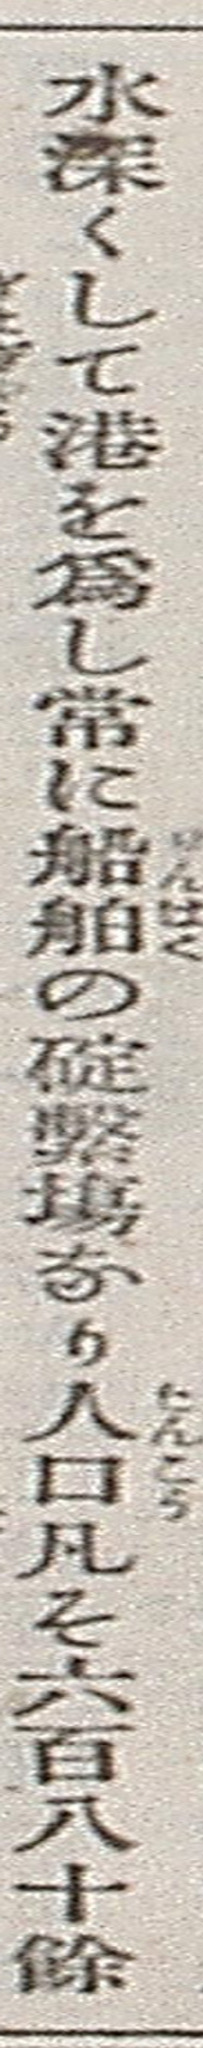水深くして港を為し常に船舶の碇繋場なり人口凡そ六百八十余
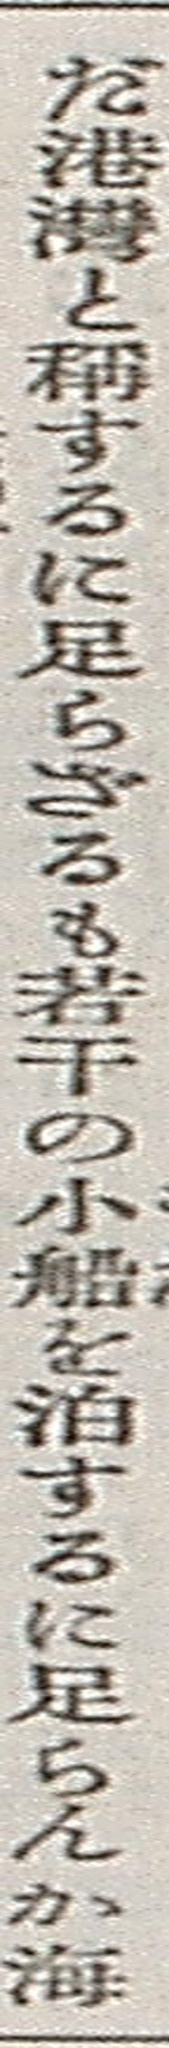だ港湾と称するに足らざるも若干の小船を泊するに足らんか海
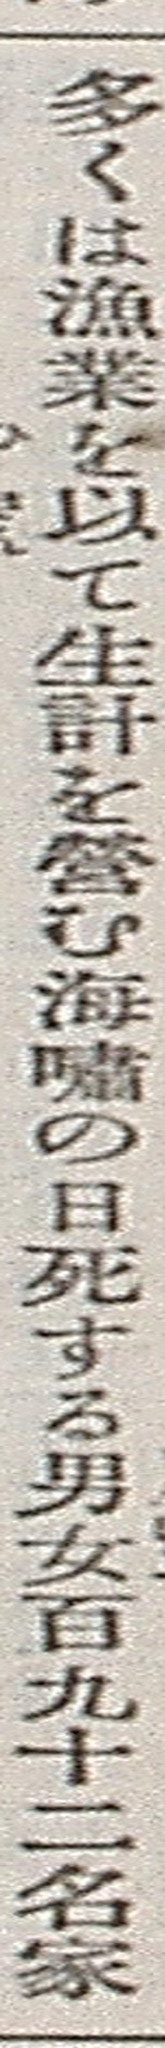多くは漁業を以て生計を營む海嘯の日死す男女百九十二名家
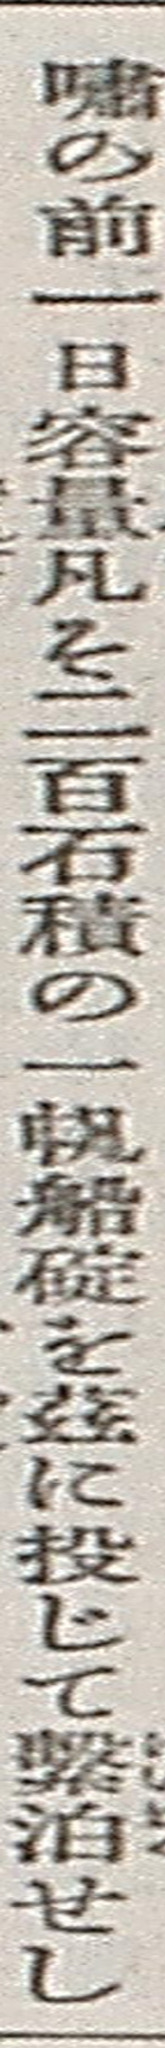嘯の前一日容量凡そニ百石積の一帆船碇を茲に投じて繋泊せし
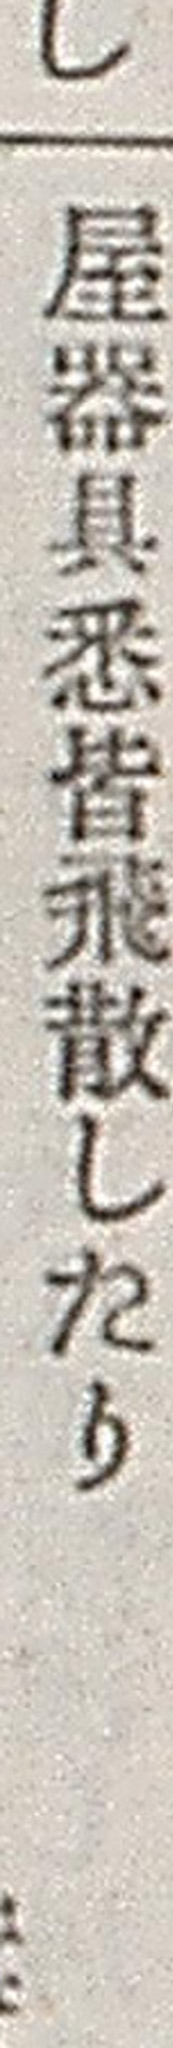屋器具悉皆飛散したり
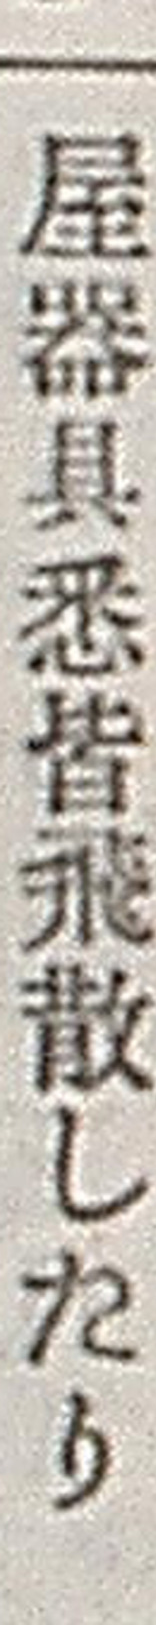屋器具悉皆飛散したり
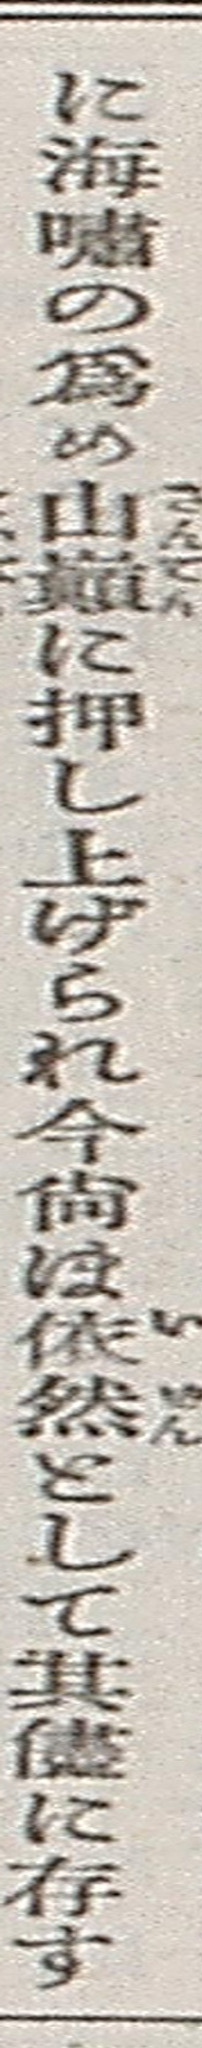に海嘯の為め山巓に押し上げられ今尚ほ依然として其侭に存す
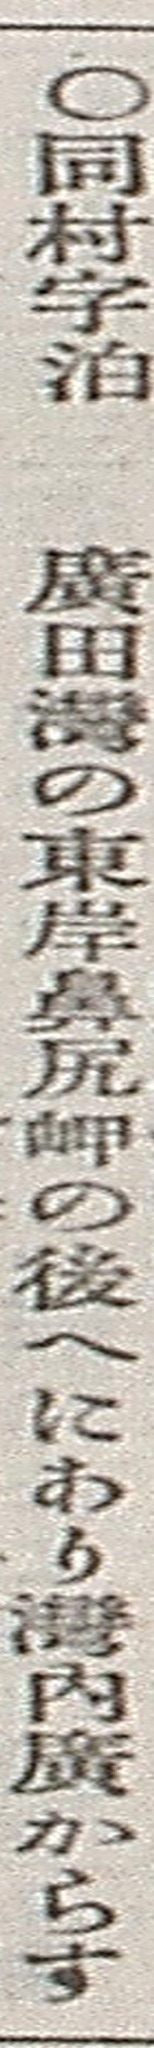○同村字泊広田湾の東岸鼻尻岬の後へにあり湾内広からす
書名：風俗畫報臨時増刊第百十九號　大海嘯被害録（中）
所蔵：東京大学地震研究所図書室 Earthquake Research Institute Library, The University of Tokyo, JAPAN
